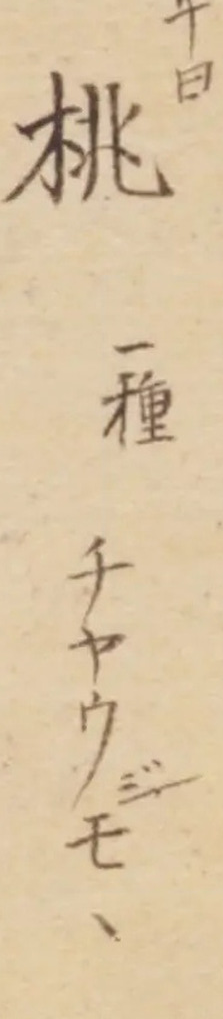桃一種チヤウジモヽ
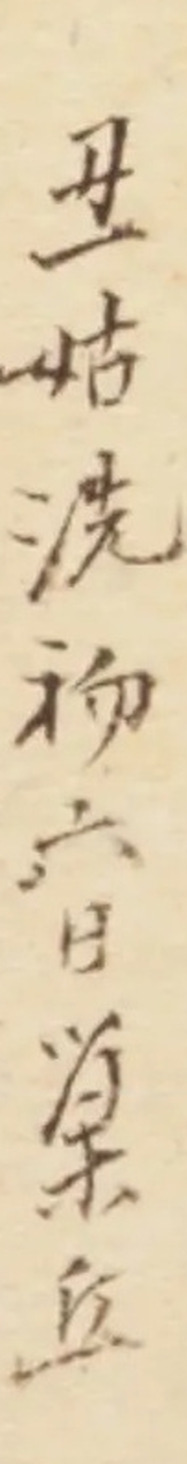丑姑洗初六日巣丘

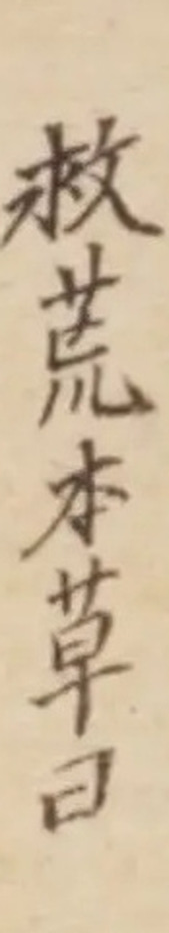救荒本草曰
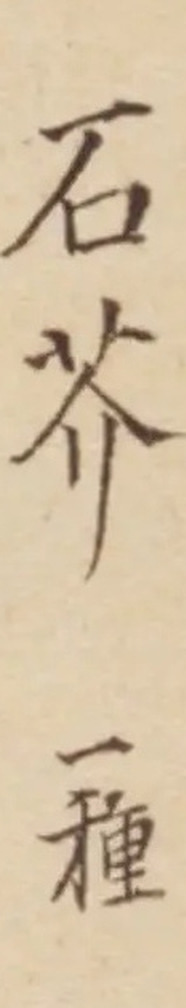石芥一種
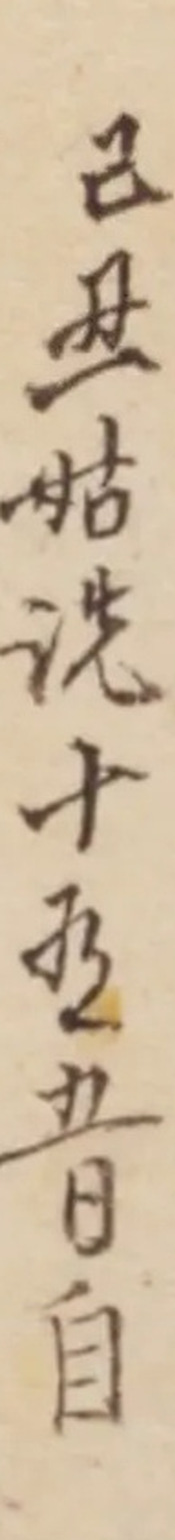己丑姑洗十有五日自
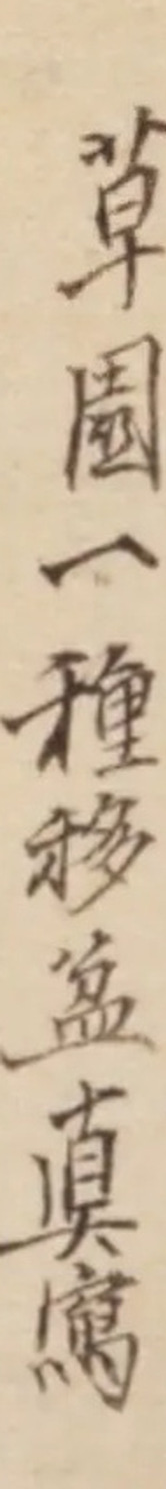草園一種移盆真寫
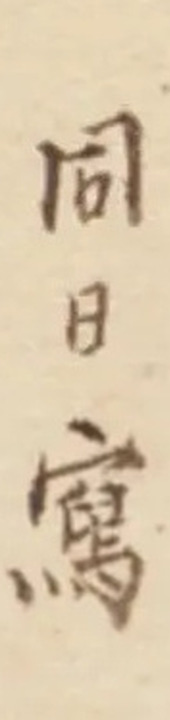同日寫
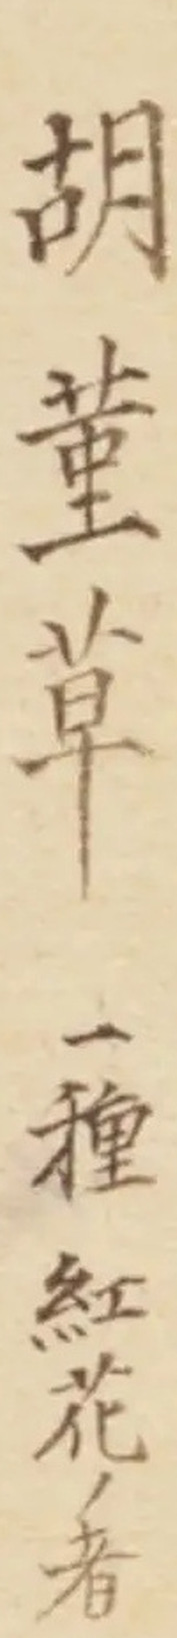胡菫草一種紅花ノ者
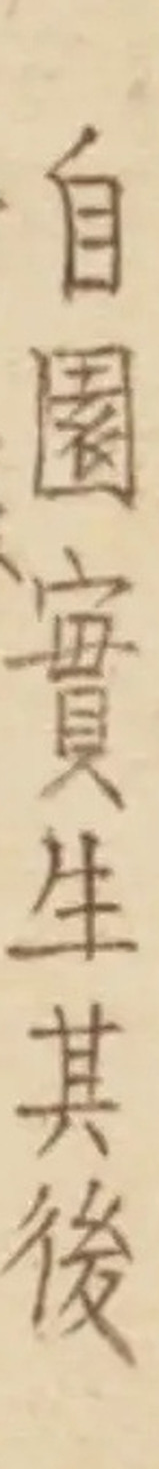自園實生其後

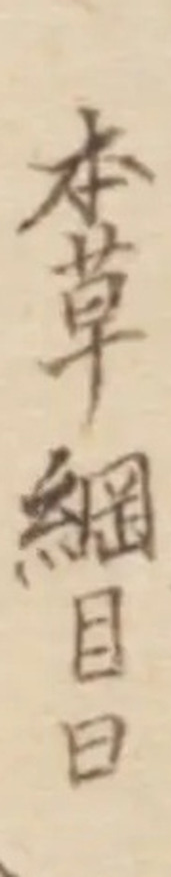本草綱目曰
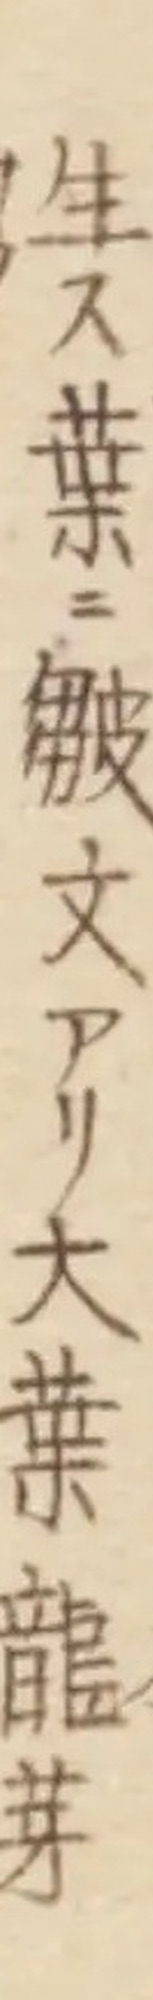生す葉に皺文あり大葉龍芽
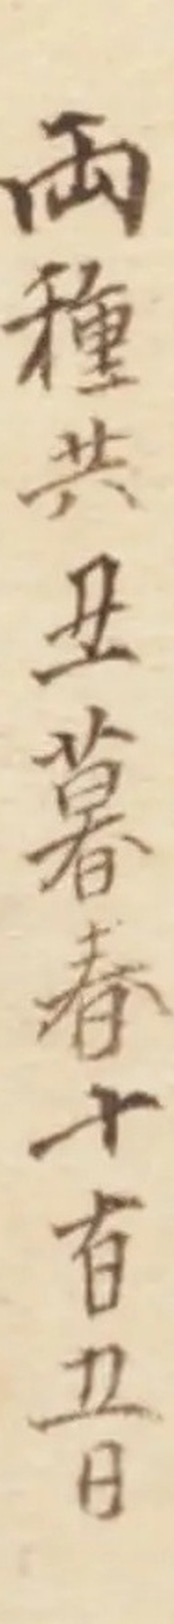両種共丑暮春十有五日
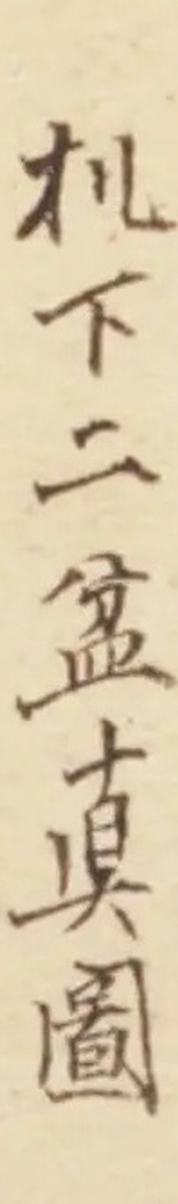机下二本真圖

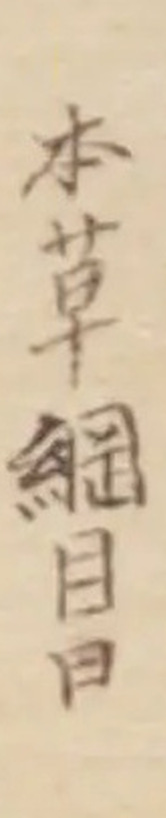本草綱目曰
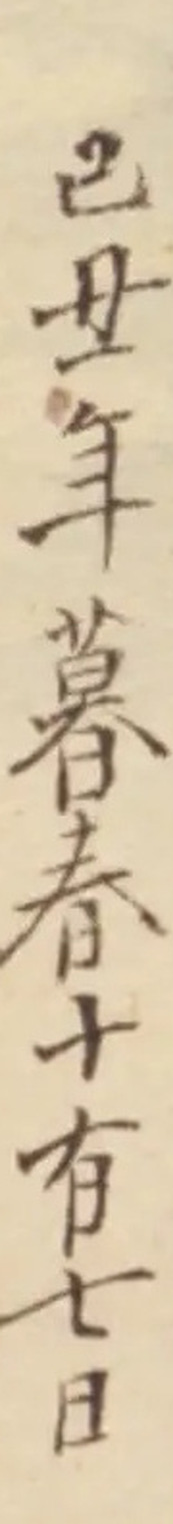己丑暮春十有七日
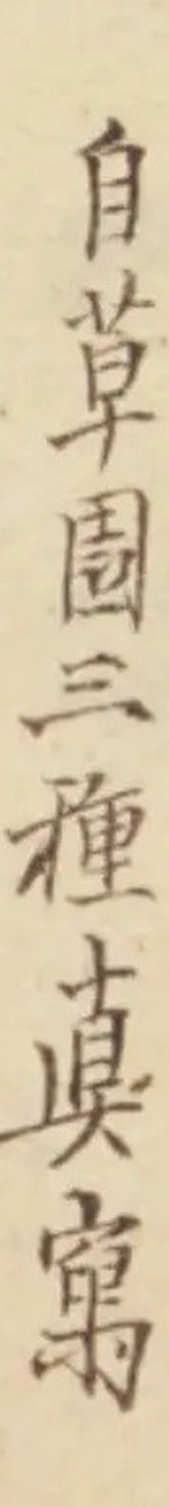自草草園三種真寫
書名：梅園草木花譜春之部. 4
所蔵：国立国会図書館 National Diet Library, JAPAN
